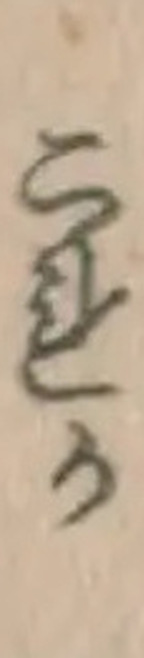これか
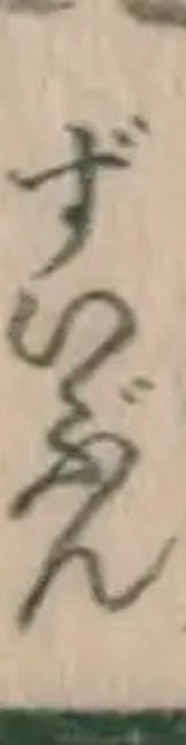ずいぶん
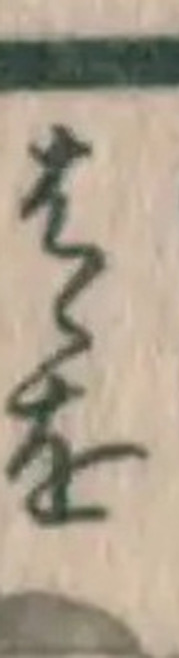はゝを
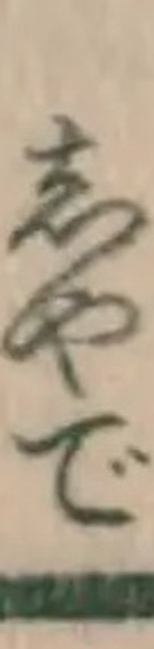しやで
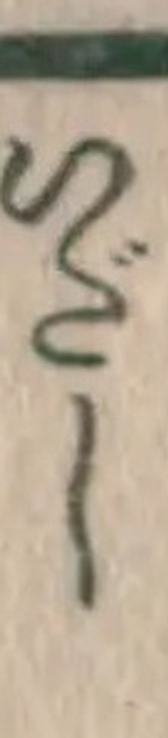いだし
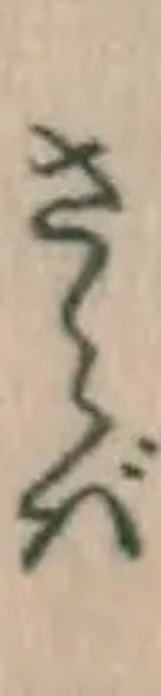さらば
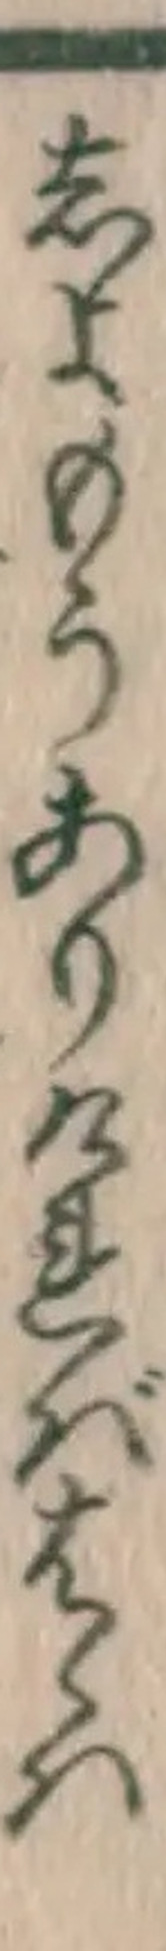しよもうありければはゝは
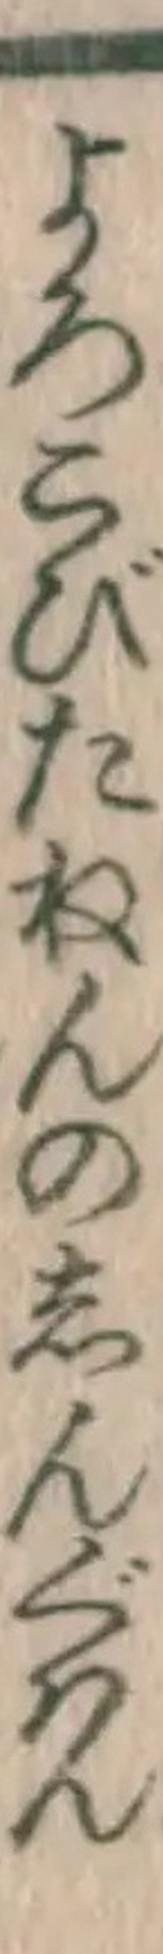よろこびたねんのしんぐはん
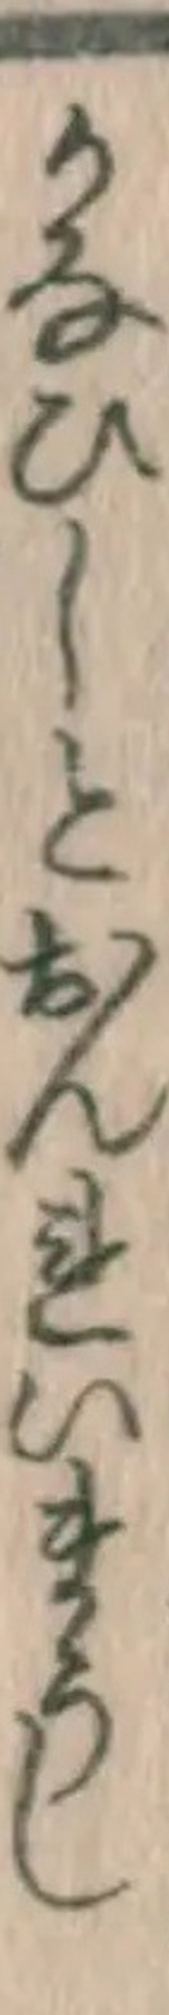かなひしとおんれいまうし
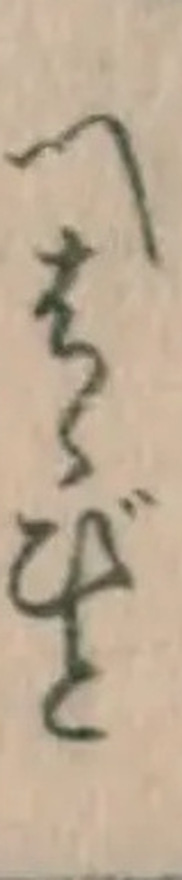〽はゝびと
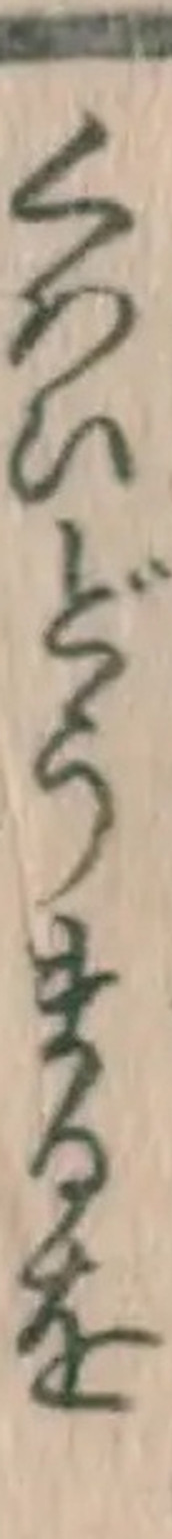くはいどうまるを
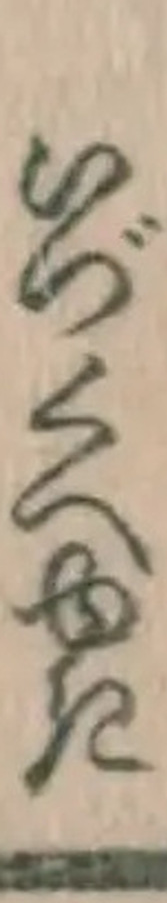いづくへゆき
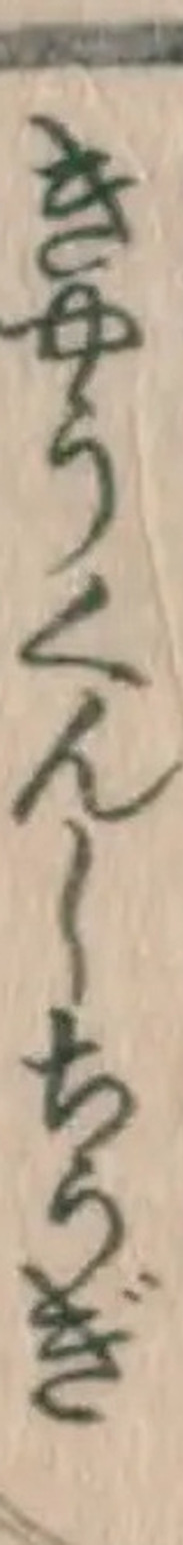きやうくんしちうぎ
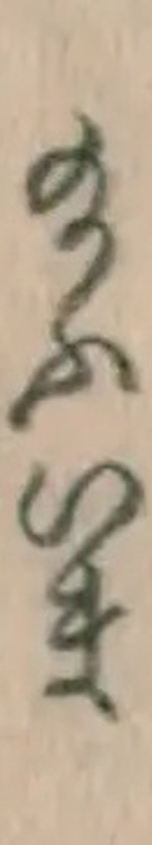給ふいま
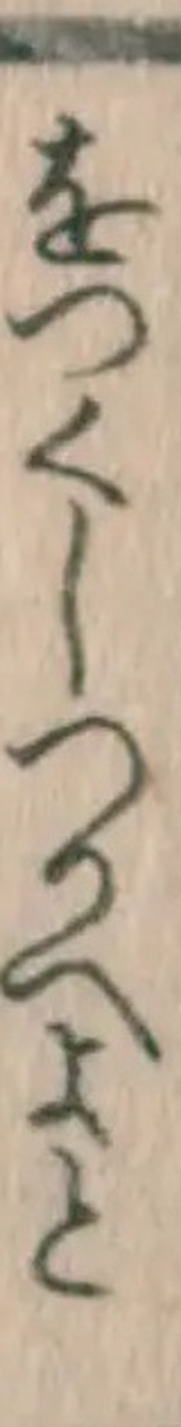をつくしつかへよと
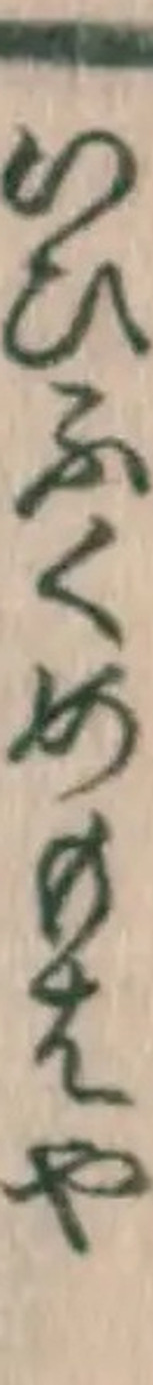いひふくめもはや
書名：金太郎
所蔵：国立国会図書館 National Diet Library, JAPAN
